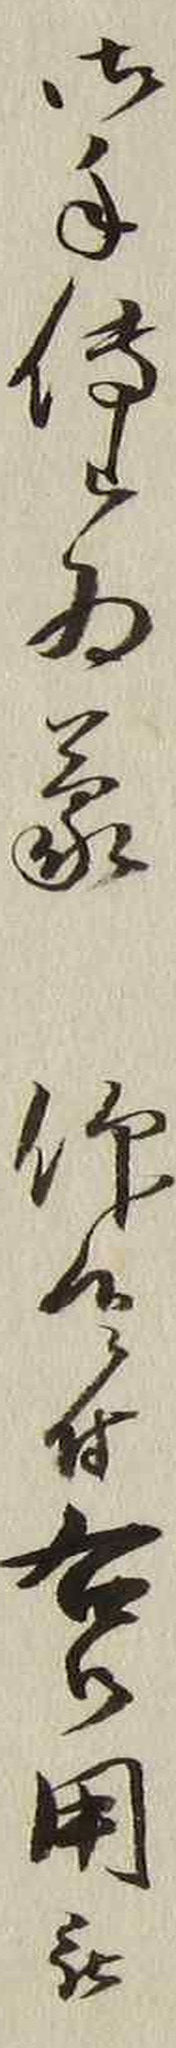御手伝被為蒙仰候ニ付右御用被
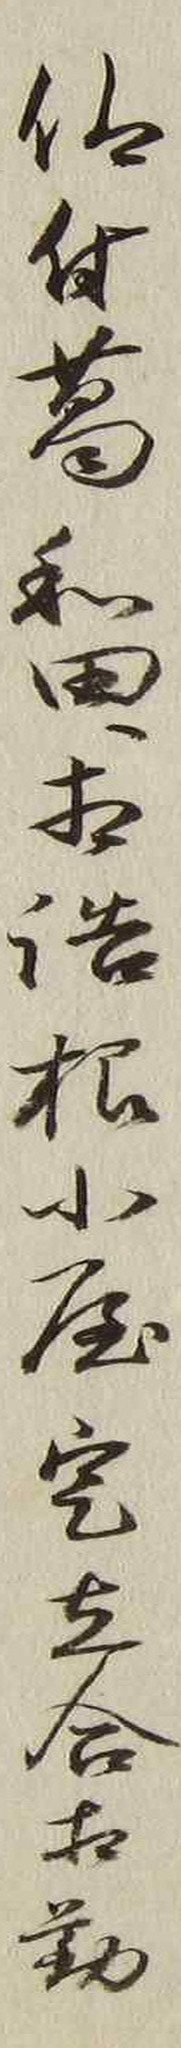仰付葛和田へ相詰根小屋定立合相勤
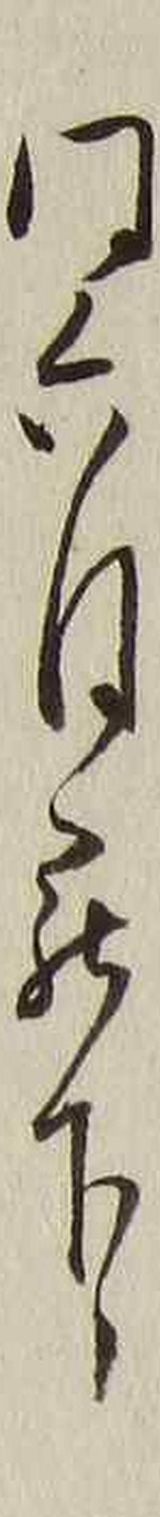同六月罷下候
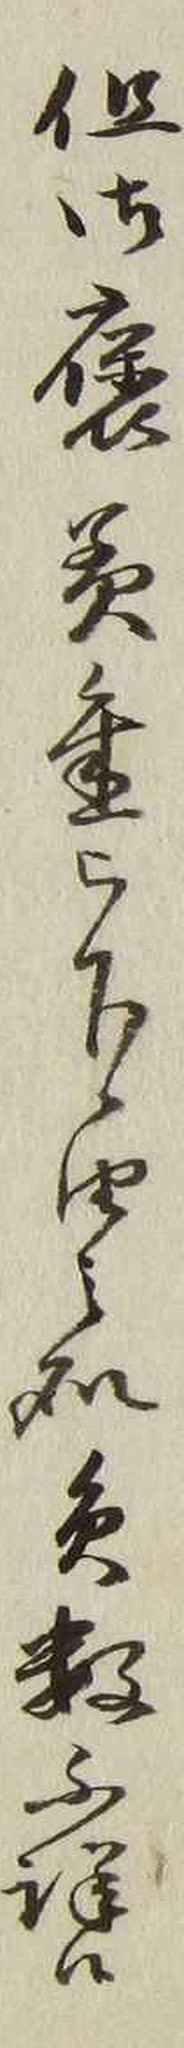但御褒美金被下候由之処員数不詳候

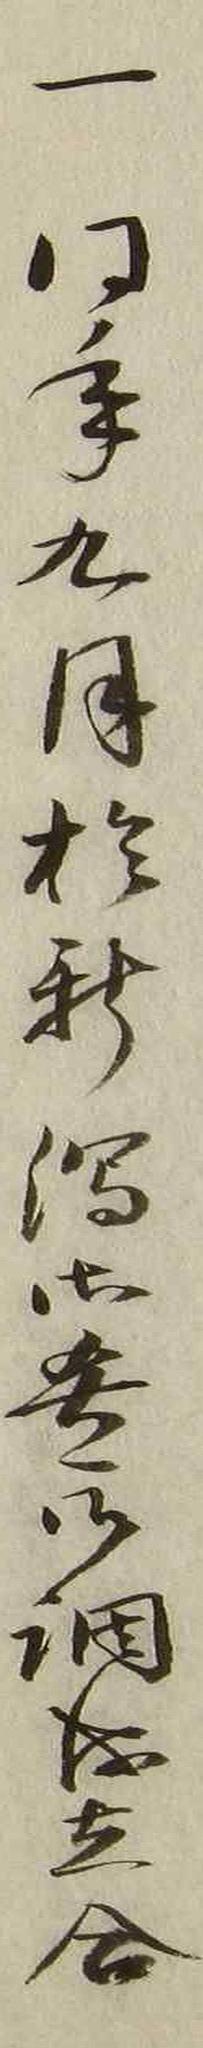一同年九月於新潟御肴御調儀立合
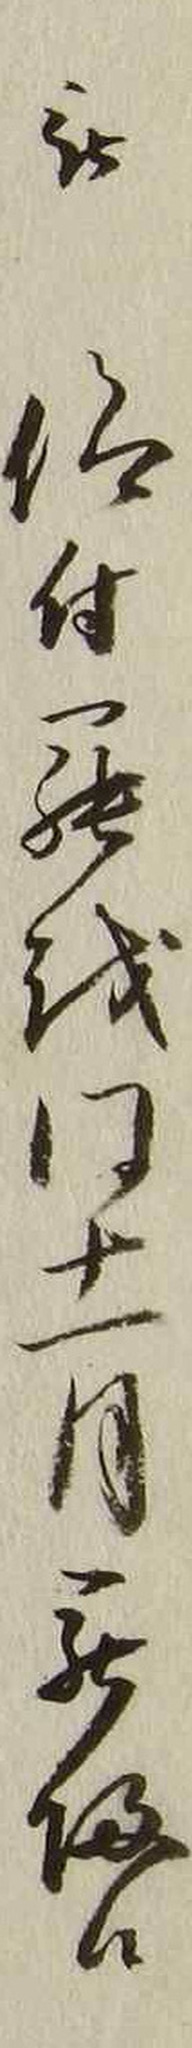被仰付罷越同十一月罷帰候
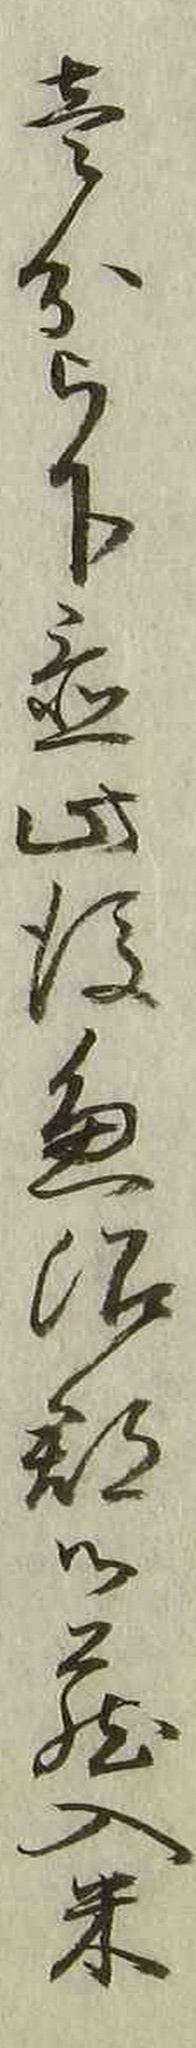壱分被下置此後魚沼郡御蔵入米
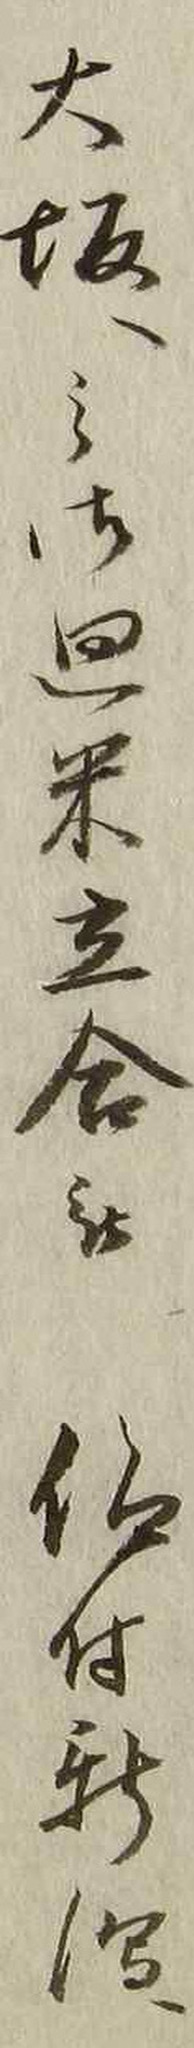大坂へ之御廻米立合被仰付新潟へ
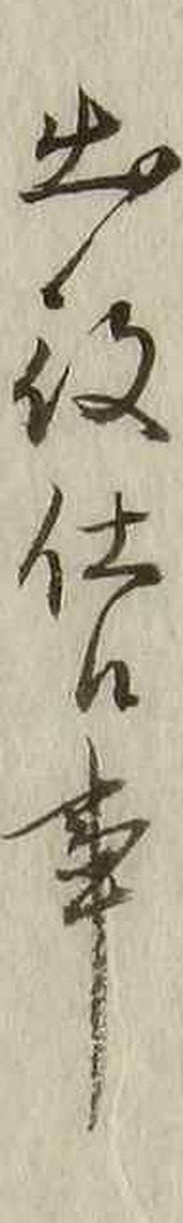出役仕候事
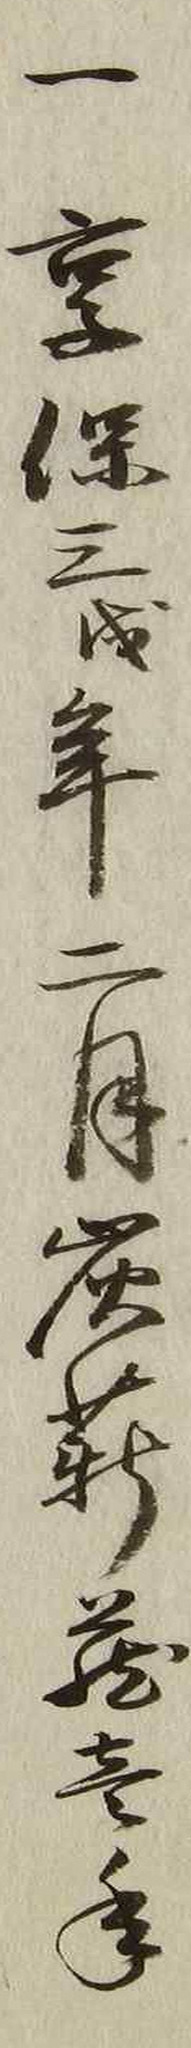一享保三戌年二月炭薪蔵壱年
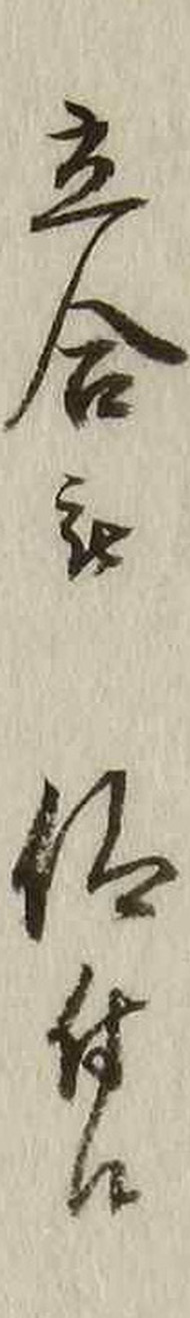立合被仰付候
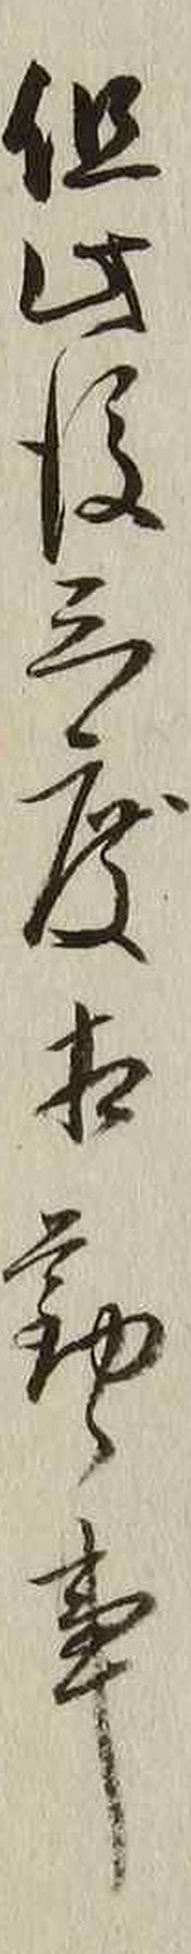但此後三度相勤候事
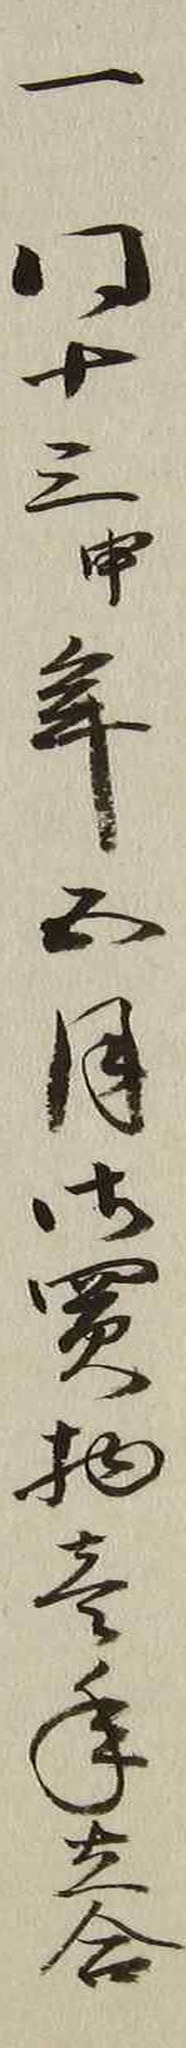一同十三申年五月御買物壱年立合
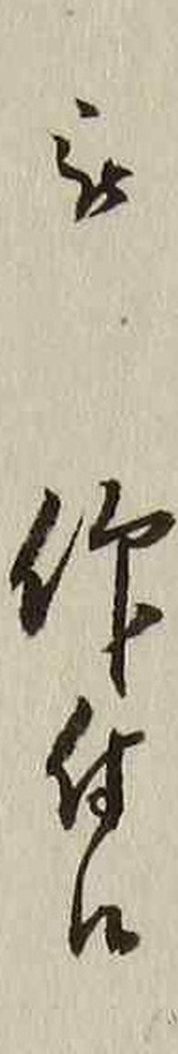被仰付候
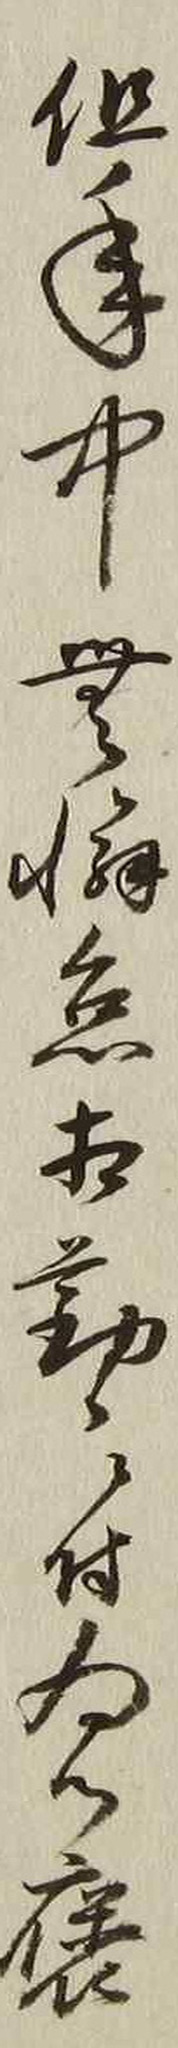但年中無懈怠相勤候ニ付為御褒
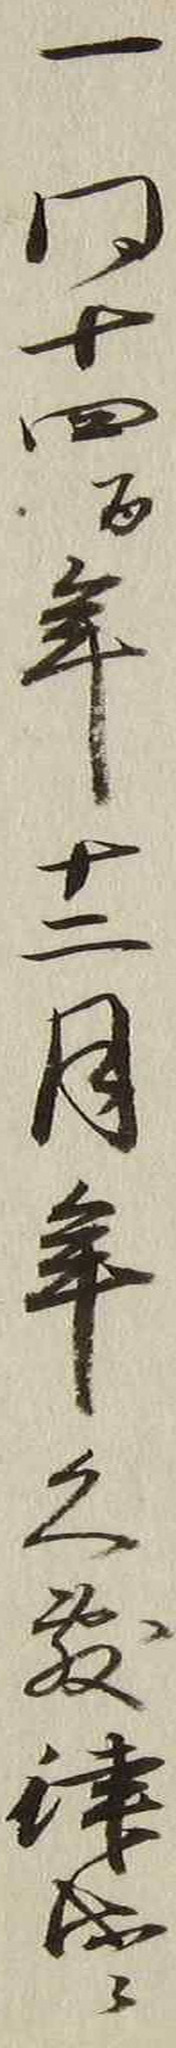一同十四酉年十二月年久敷律儀ニ
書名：諸士系譜　巻之102　か之部10
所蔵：会津若松市立会津図書館
